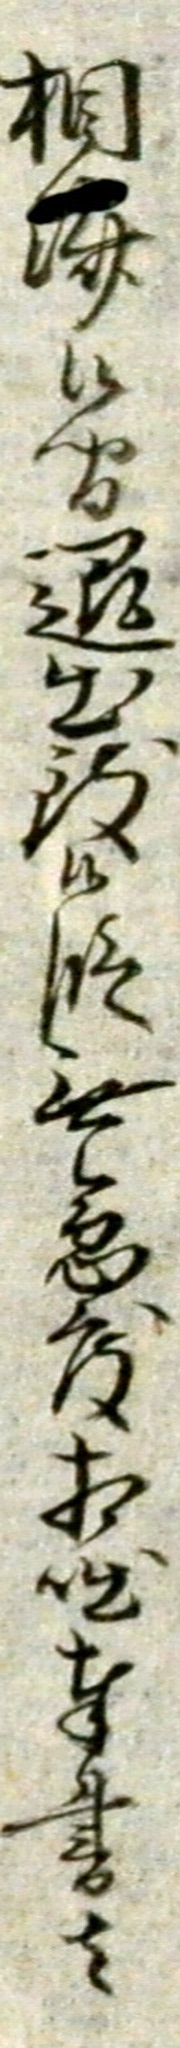相済候間退出致候段無急度相咄奉書者
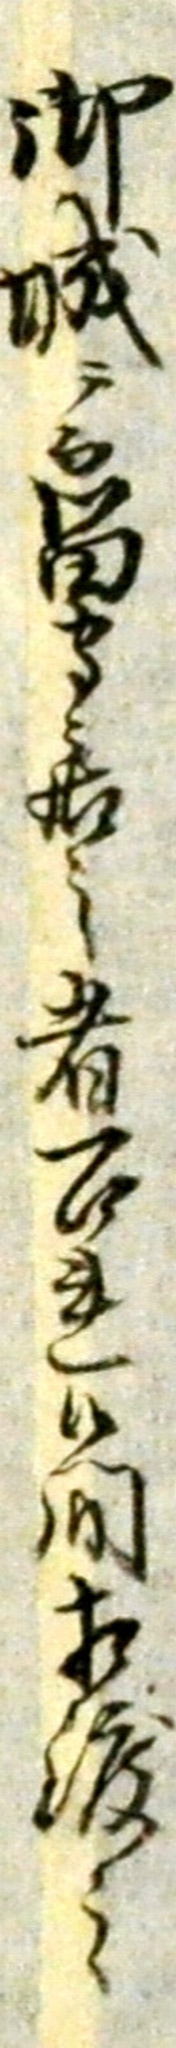御城ニ而留守居之者召連候間相渡之
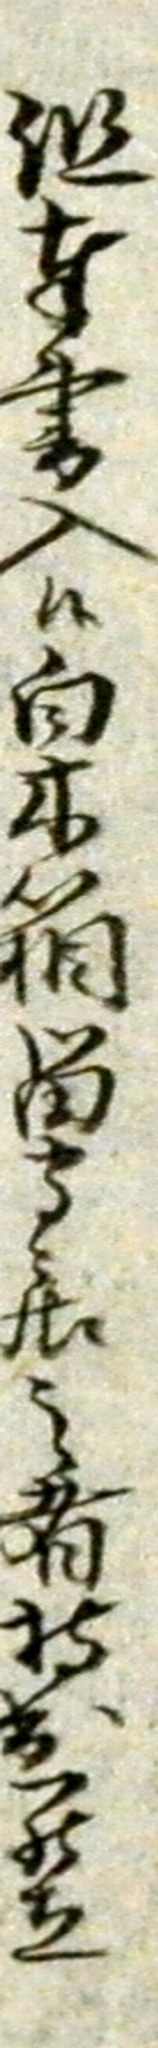但奉書入候白木箱留守居之者持出罷在

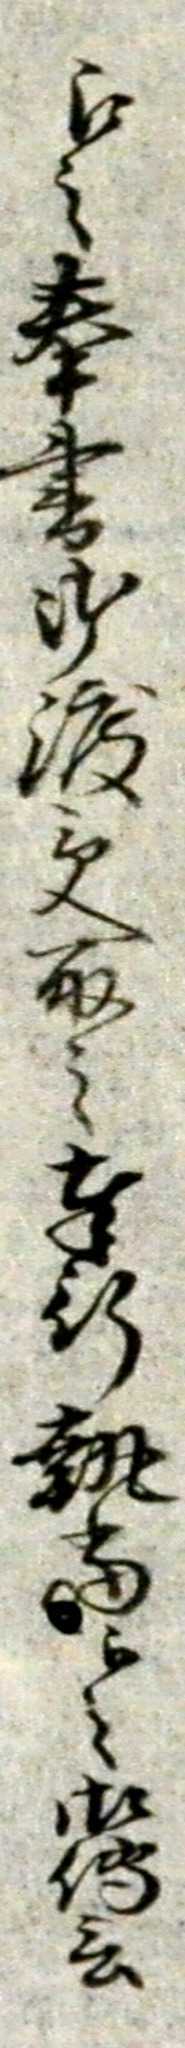江之奉書御渡受取之奉行執當江之御伝言
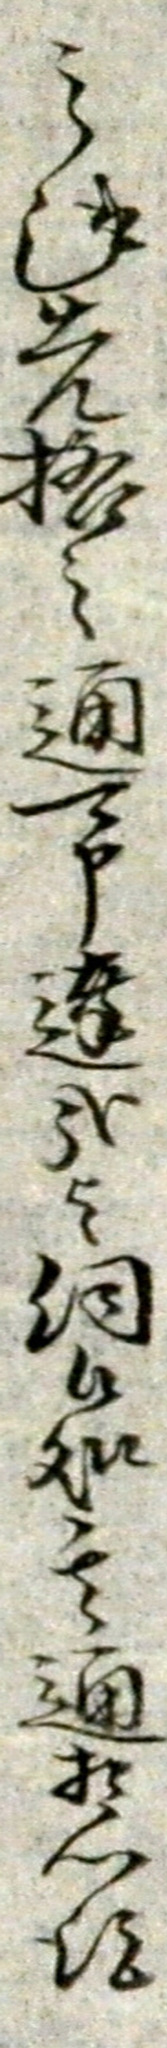之趣先格之通可申達哉与伺候処其通相心得
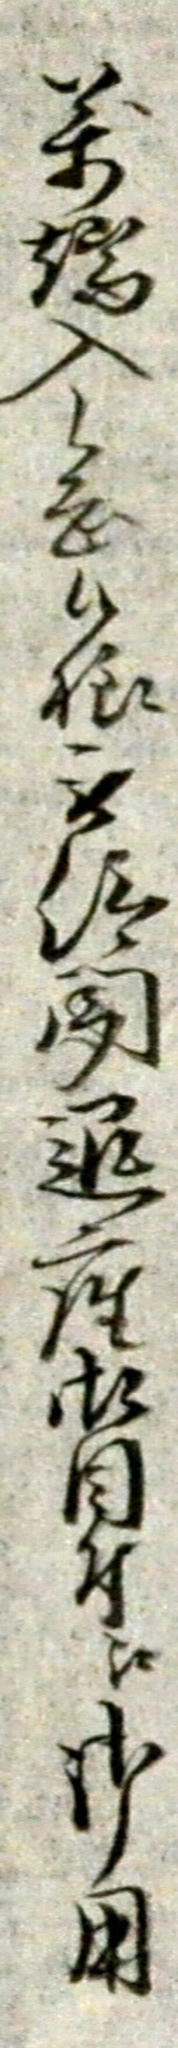万端入念候様被仰聞退座御目付江御用
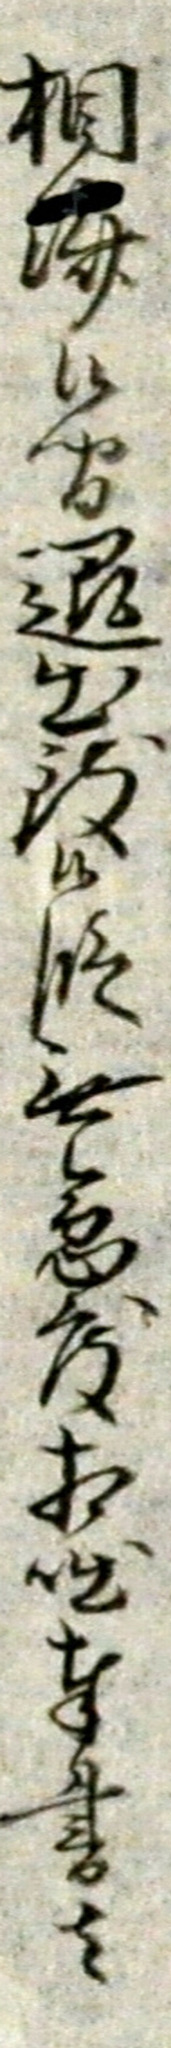相済候間退出致候段無急度相咄奉書者
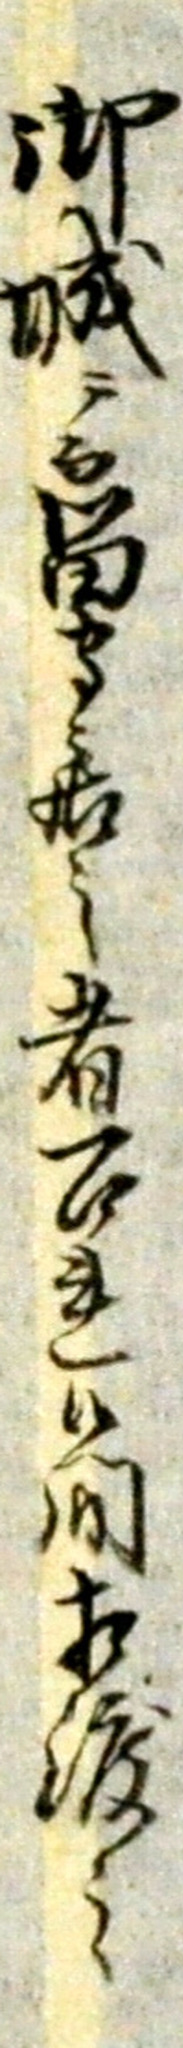御城ニ而留守居之者召連候間相渡之
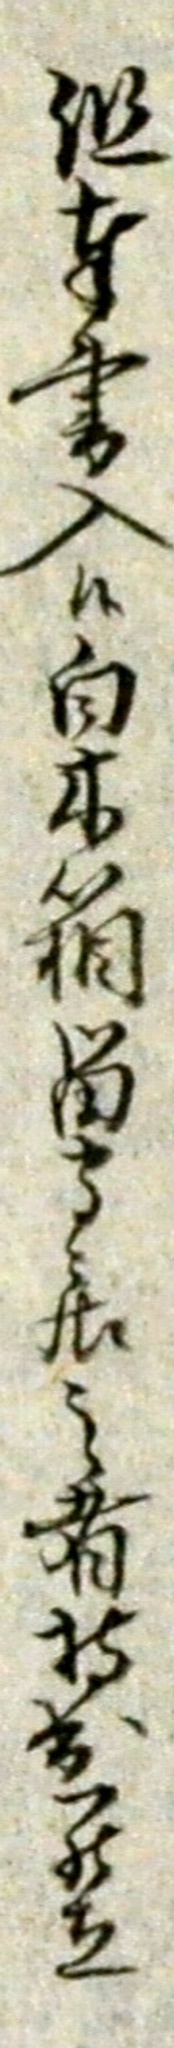但奉書入候白木箱留守居之者持出罷在
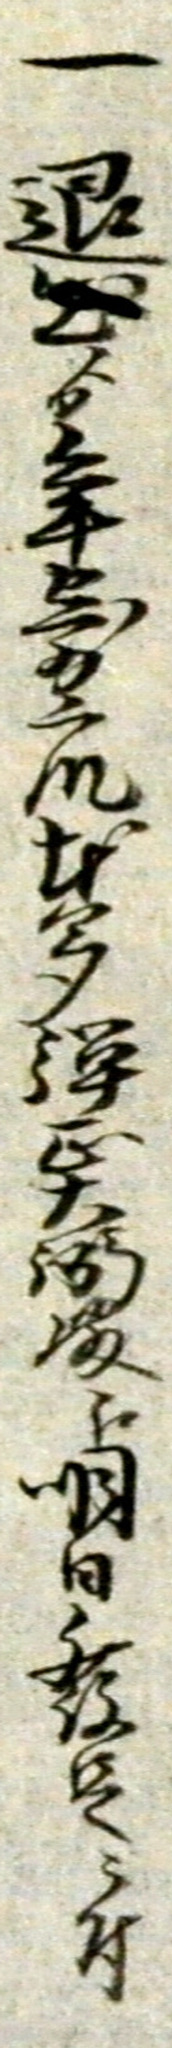一退出ゟ年寄衆本多弾正大弼殿江明日発足ニ付
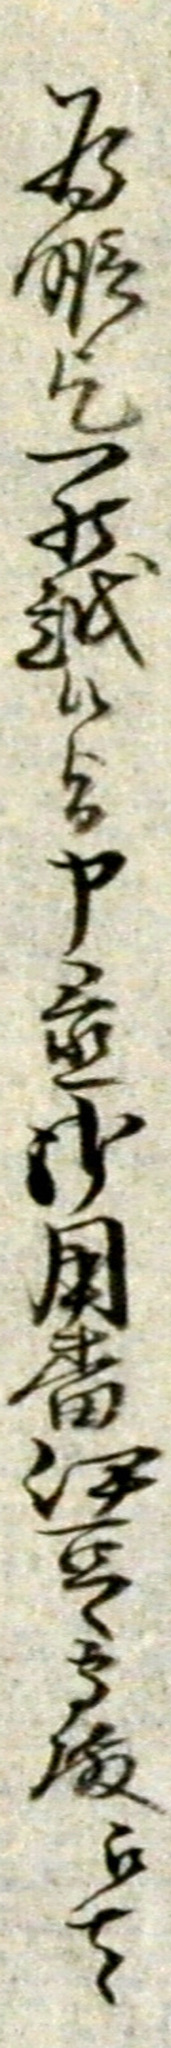為暇乞罷越候旨申置御用番伊豆守殿江守殿江者
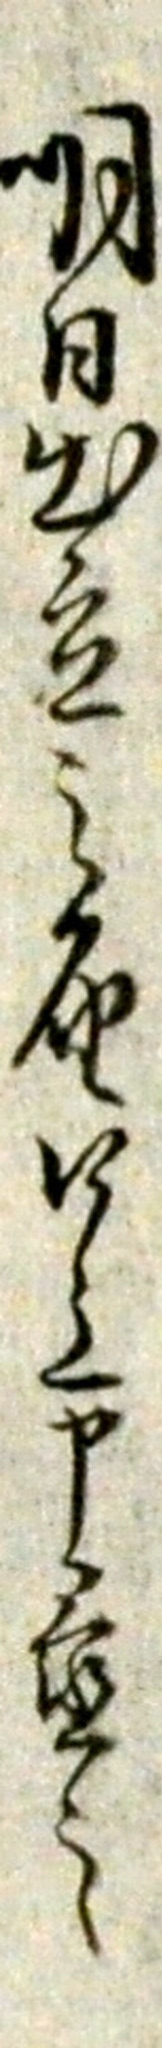明日出立之届口上申置之
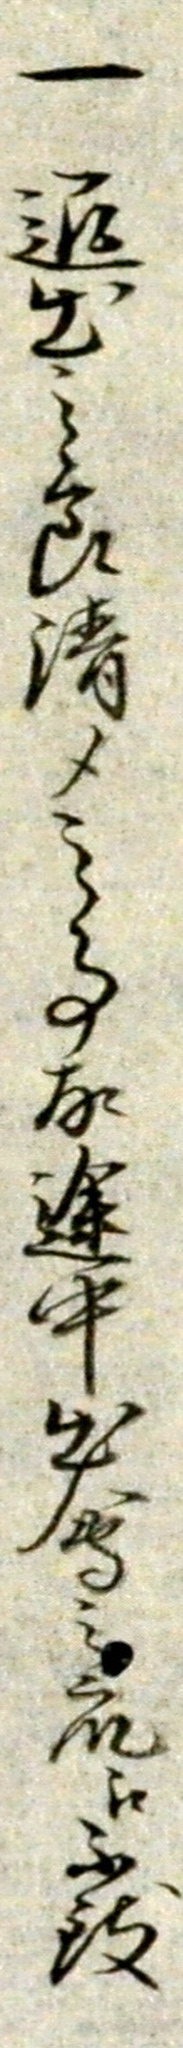一退出之節清メ之事故途中出会会釈使ニ而申遣候
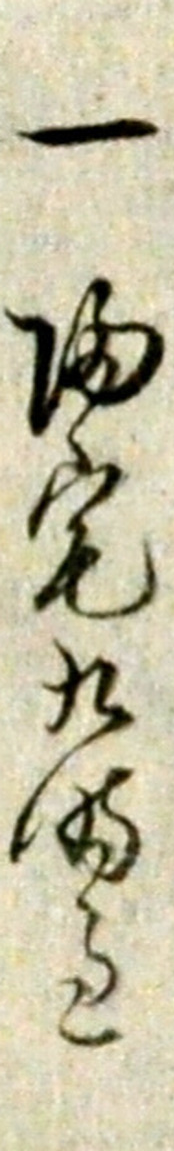一帰宅九時過
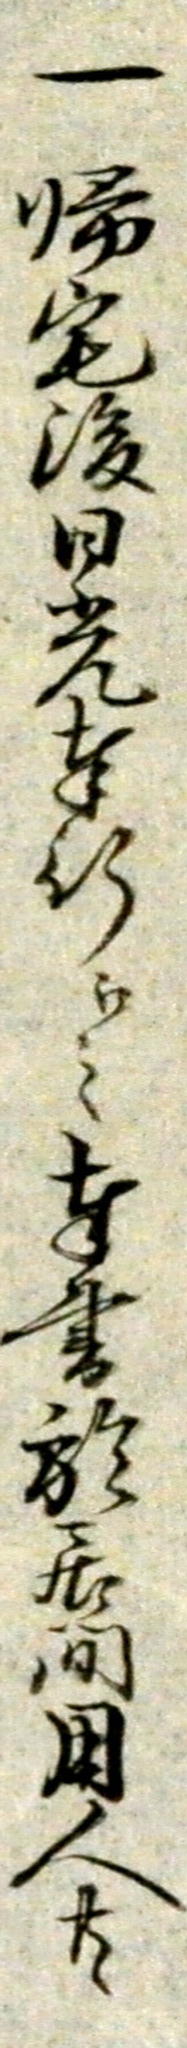一帰宅後日光奉行江之奉書於居間用人共
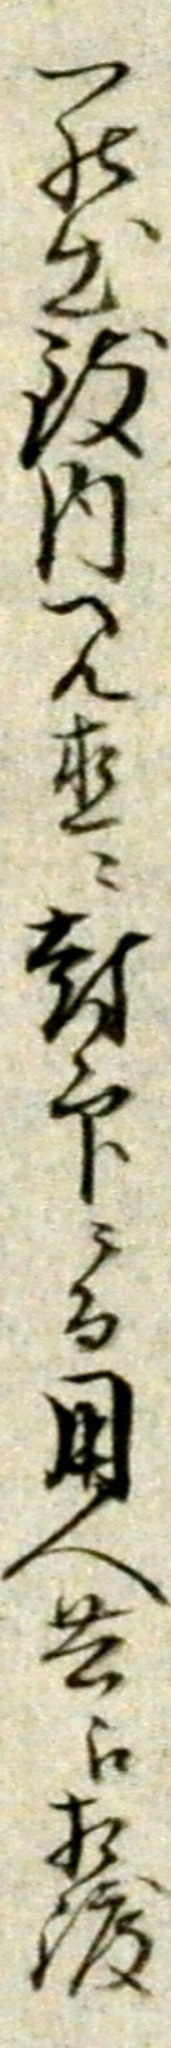罷出致内見直ニ封印ニ而用人共江相渡
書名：日光御名代相勤候節ノ留
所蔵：伊那市立高遠町図書館・合同会社AMANE
